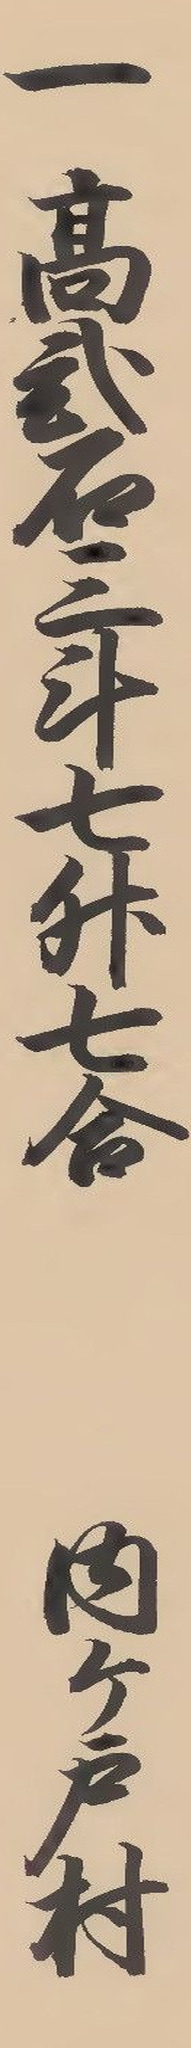一高弐石三斗七升七合内ヶ戸村
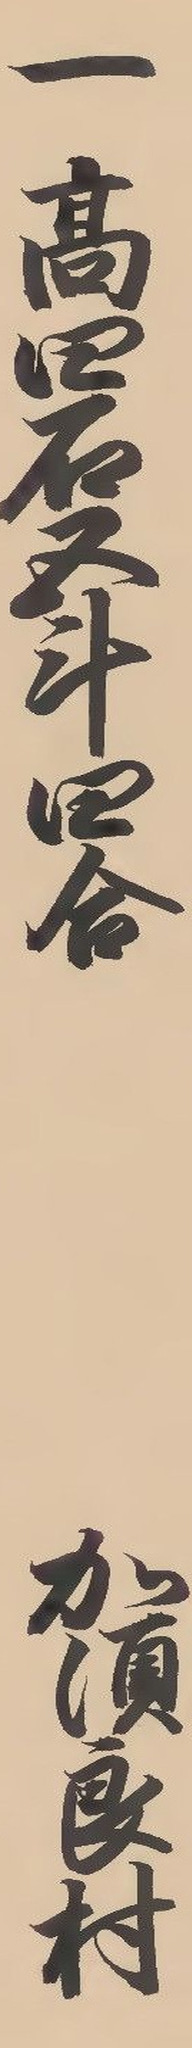一高四石五斗四合加須良村
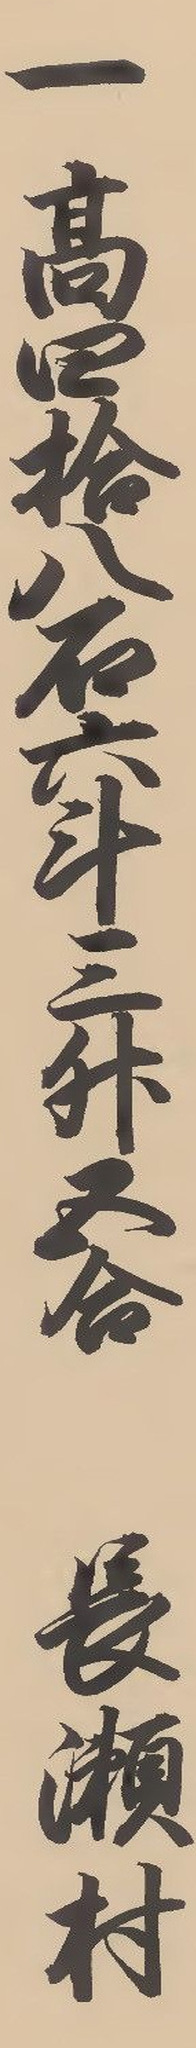一高四拾八石六斗三升五合長瀬村
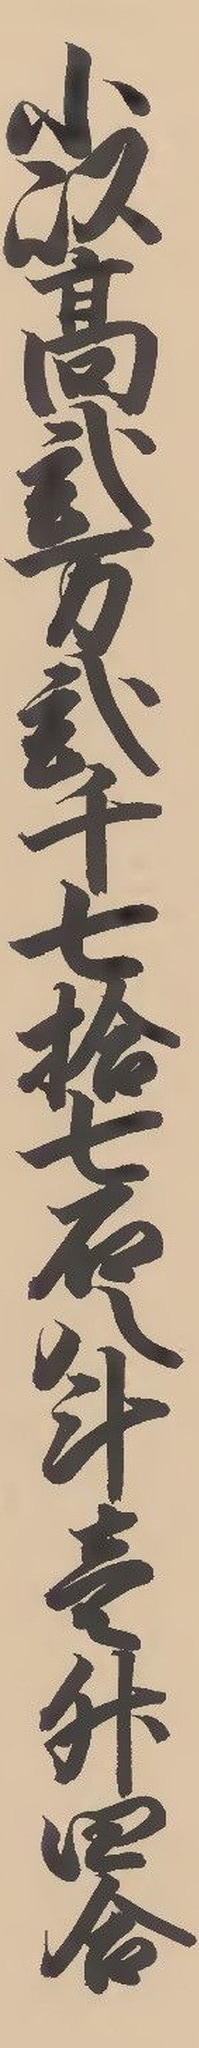小以高弐万弐千七拾七石八斗壱升四合

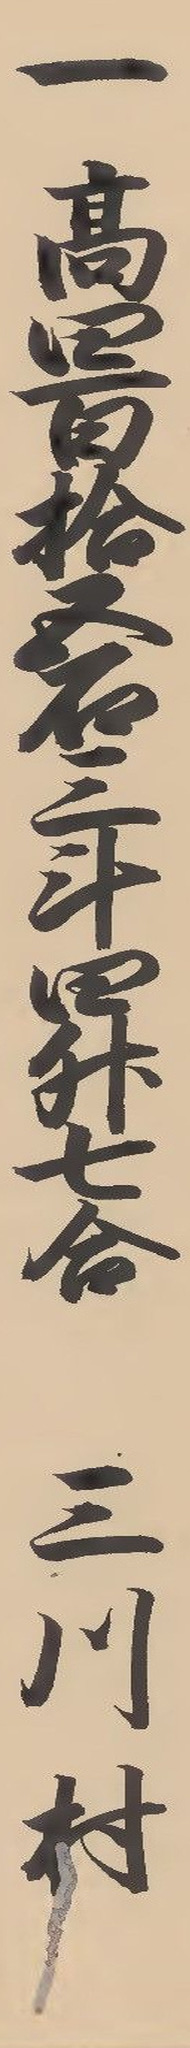一高四百拾五石三斗四升七合三川村
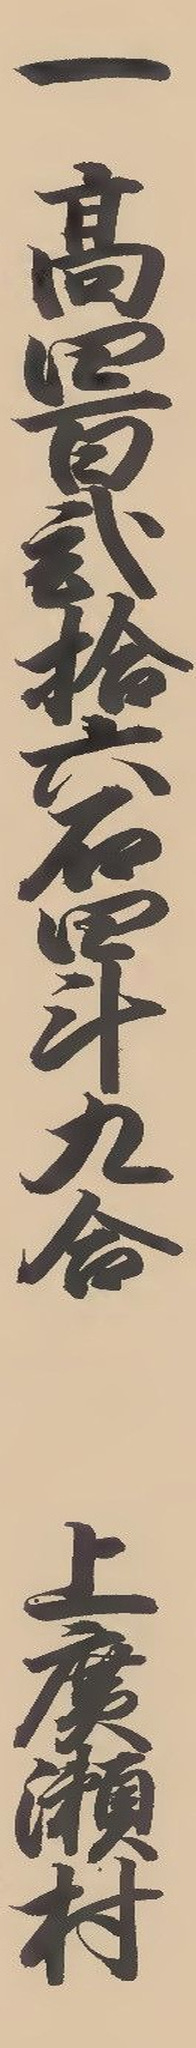一高四百弐拾六石四斗九合上広瀬村
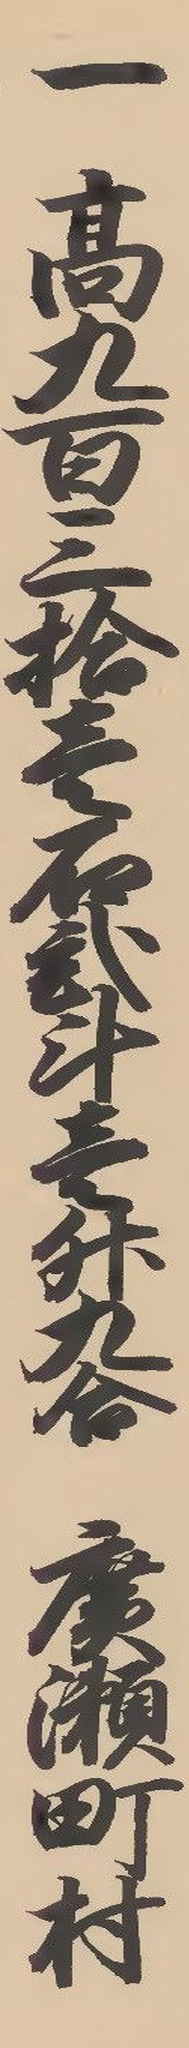一高九百三拾壱石弐斗壱升九合広瀬町村
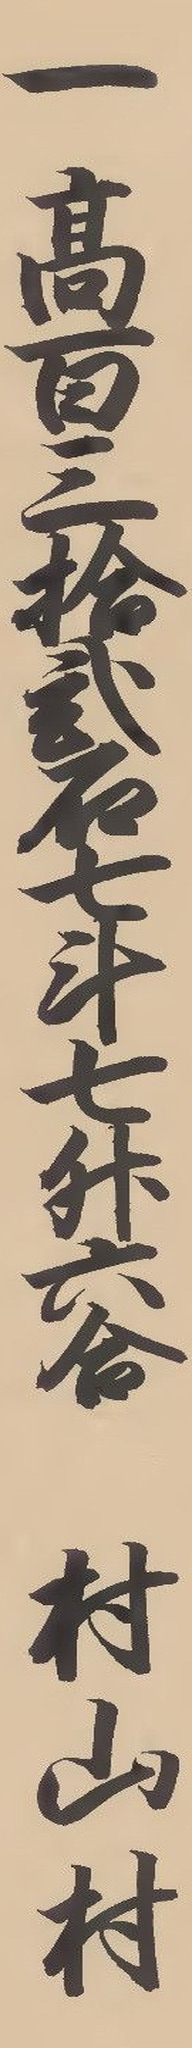一高百三拾弐石七斗七升六合村山村
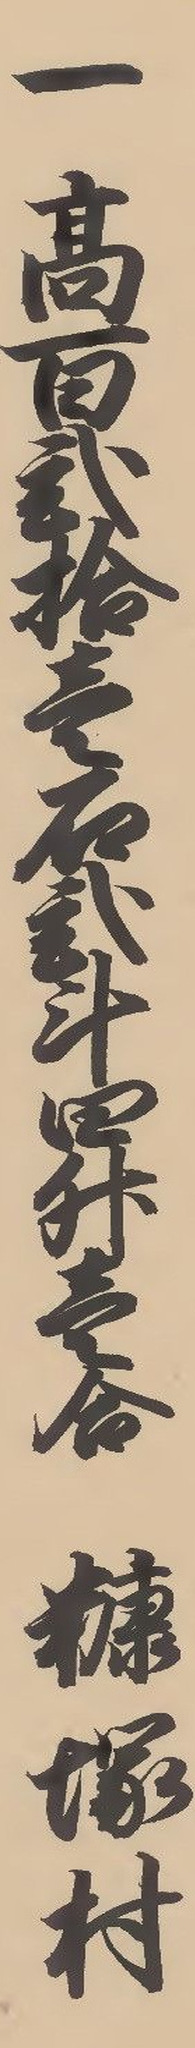一高百弐拾壱石弐斗四升壱合糠塚村
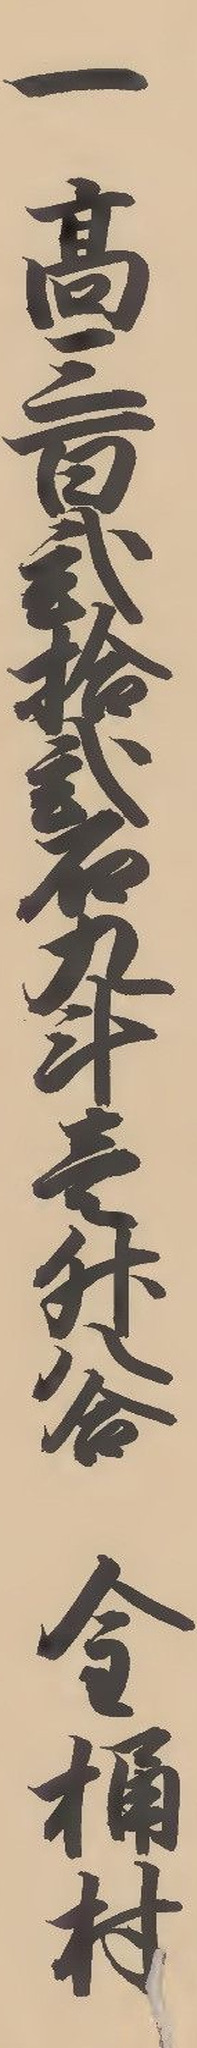一高三百弐拾弐石九斗壱升八合金桶村
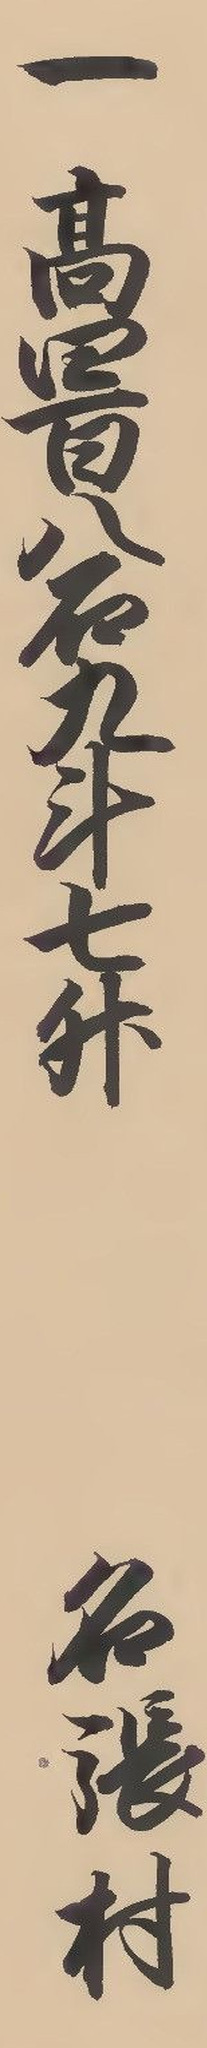一高四百八石九斗七升名張村

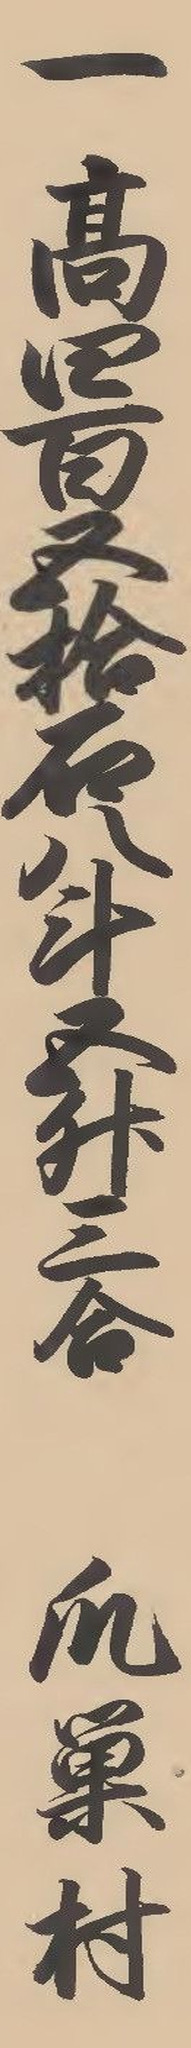一高四百五拾石八斗五升三合瓜巣村
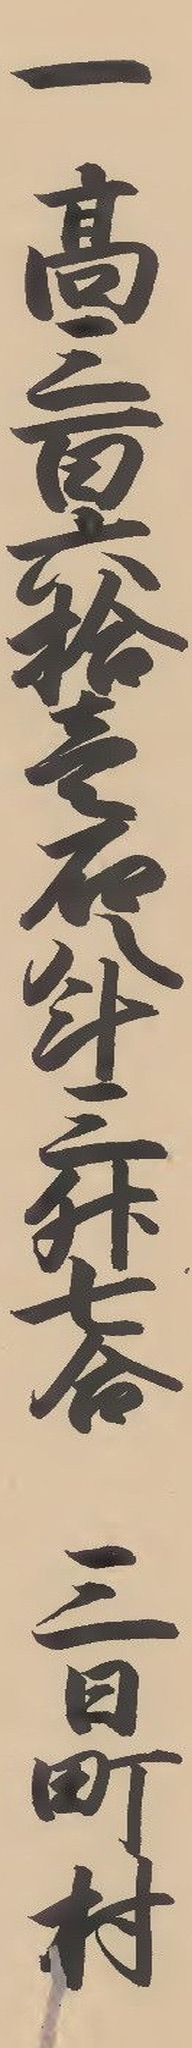一高三百六拾壱石八斗三升七合三日町村
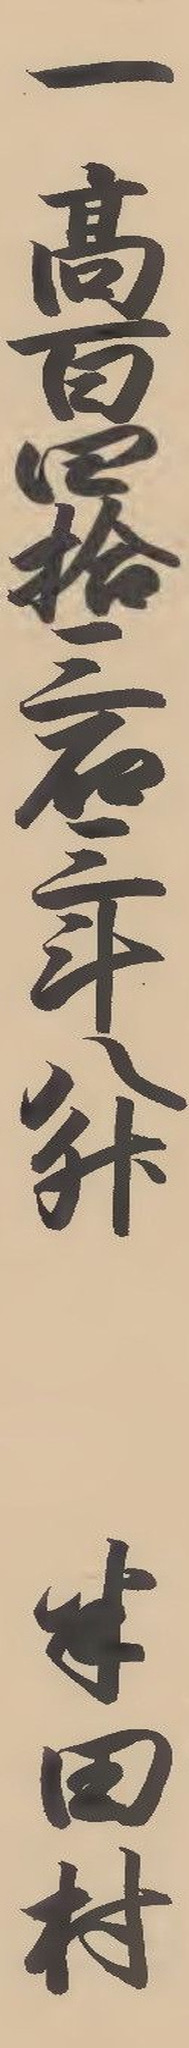一高百四拾三石三斗八升半田村
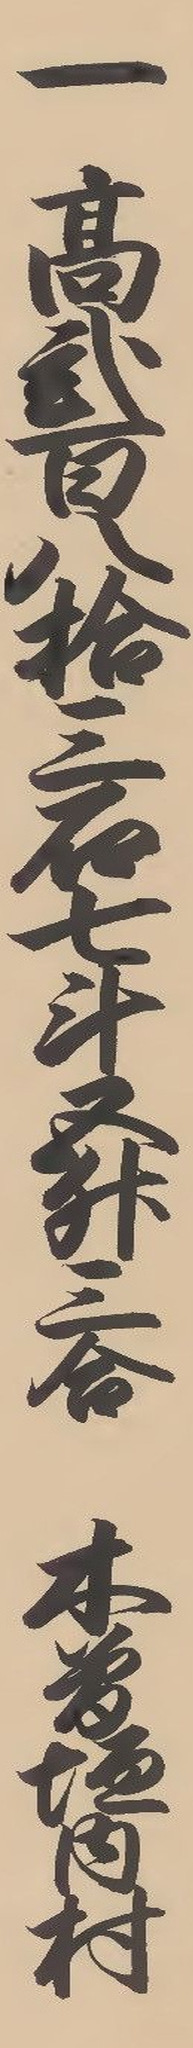一高弐百八拾三石七斗五升三合木曽垣内村
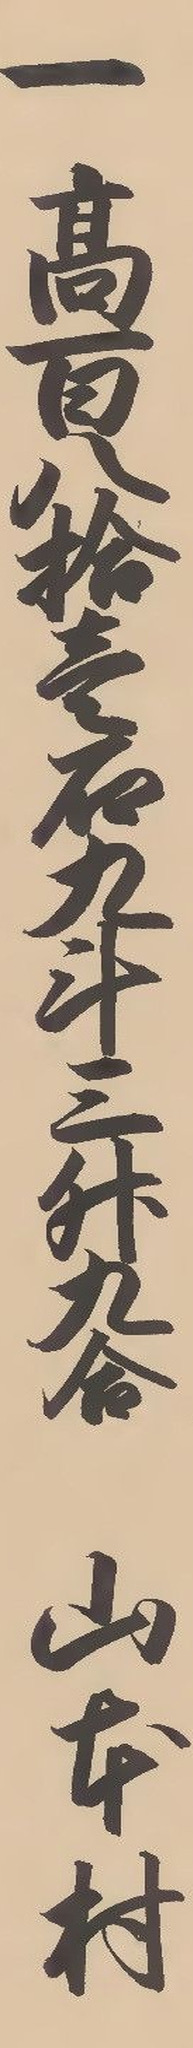一高百八拾壱石九斗三升九合山本村
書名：飛騨国郷帳
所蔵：国立公文書館 National Archives of Japan
